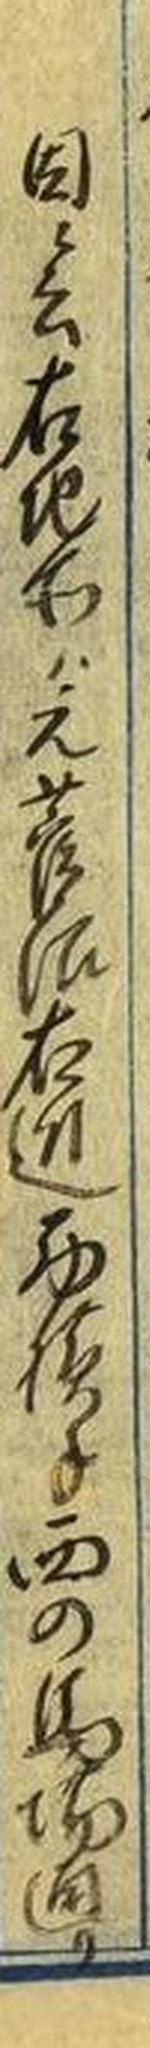因に云右地所は元菅沼右近西横手西の馬場通り
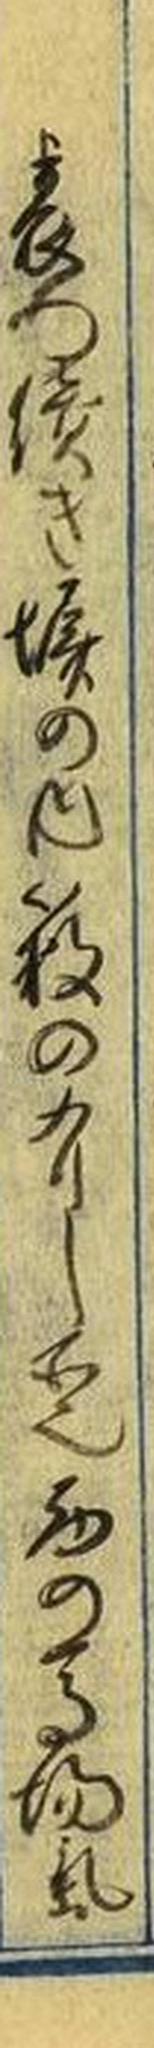表門続き塀の内薮の有し所也西の馬場気
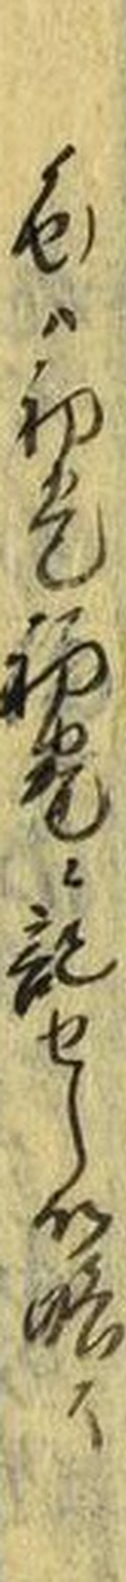色は初巻初巻に記せし故略す
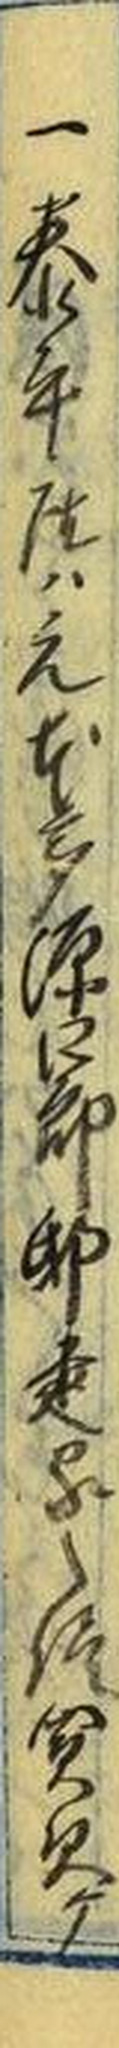一泰年座は元本多源四郎邸建家之侭買受け
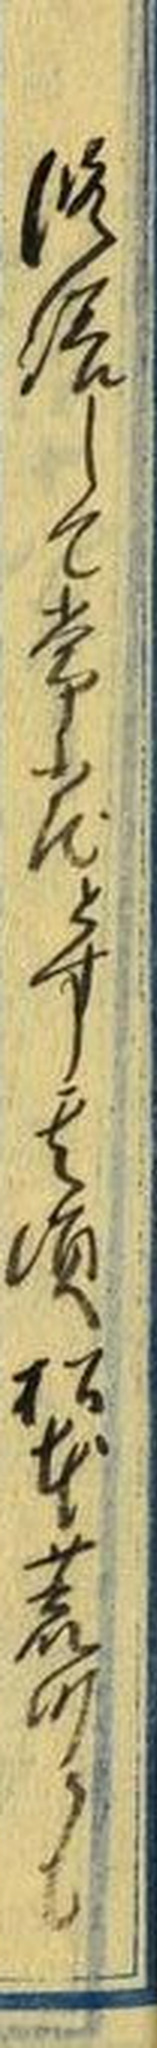修繕して常小屋とす其頃松本荒町にも
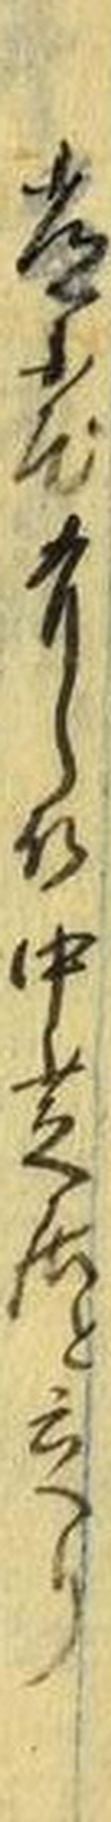常小屋有し故中芝居と云へり

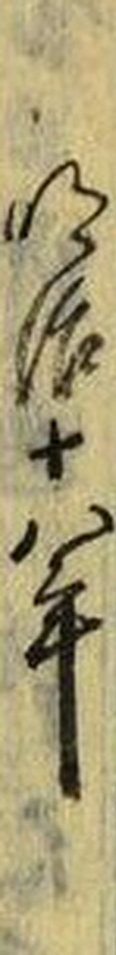明治十八年
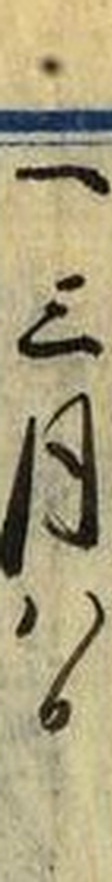一三月八日
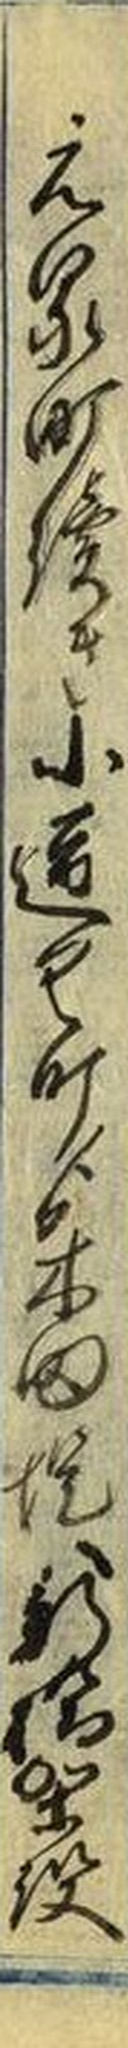元泉町続き小道具町ゟ木田堤へ新橋架設
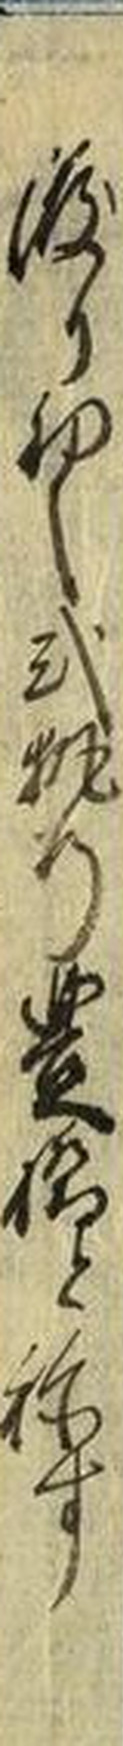渡り初之式執行豊橋と称す
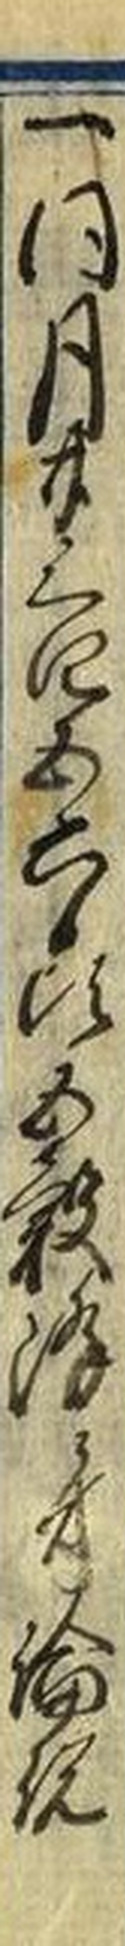一同月廿三四五六日頃五穀降に付論説
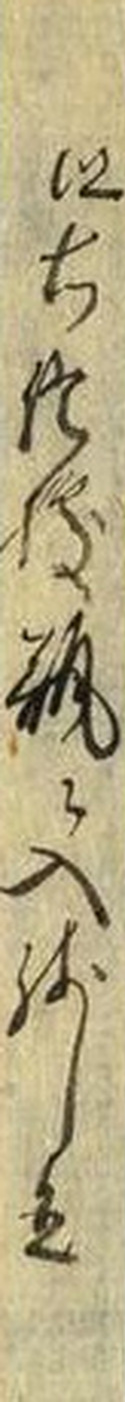但右証拠瓶に入残し置
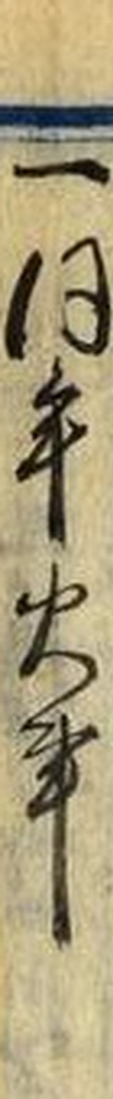一同年火事
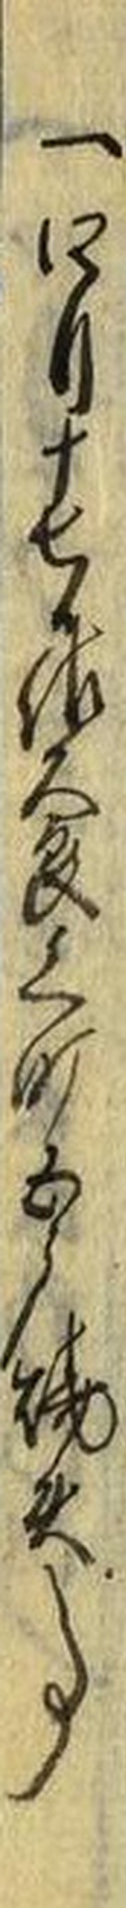一四月十七日佐久良上町五戸焼失之事

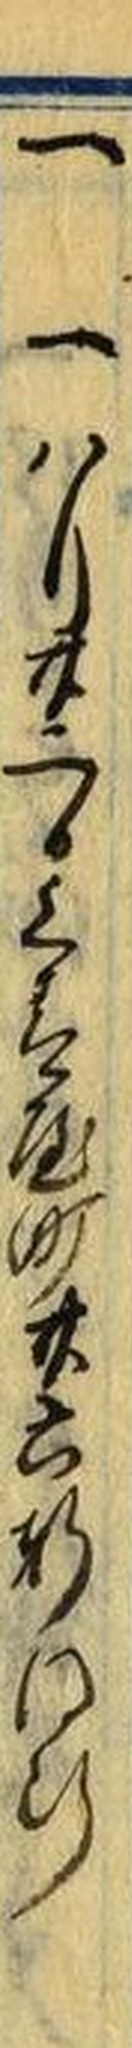一一八月廿二日上有屋町廿六軒同断
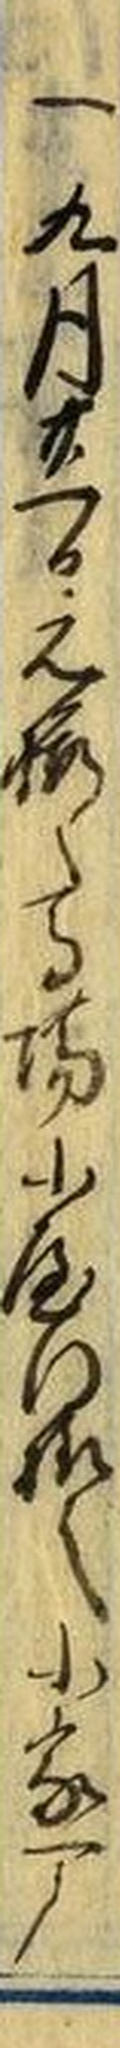一九月廿一日元桜之馬場小屋同様之小家一戸
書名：温古集 五巻
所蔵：福井県文書館 Fukui Prefectural Archives
